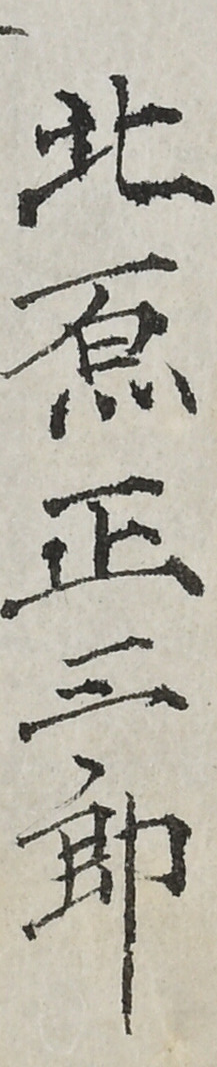北原正三郎
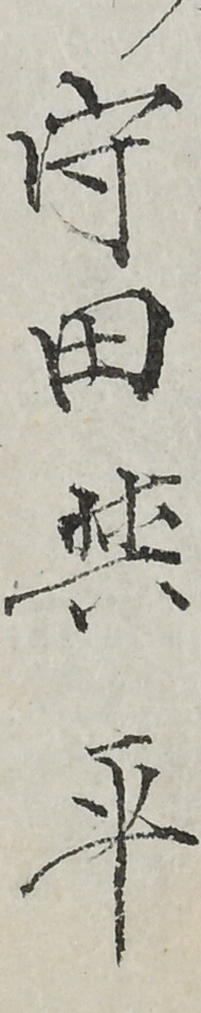守田与平

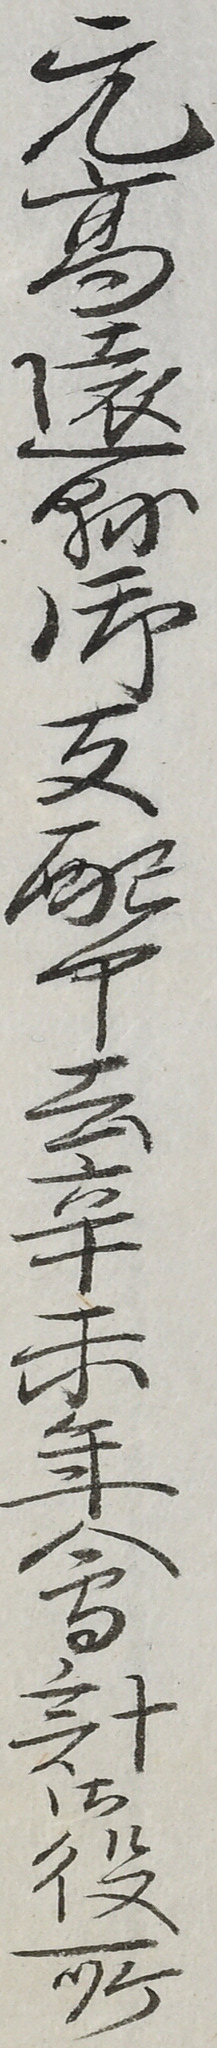元高遠県御支配中去辛未年会計御役所
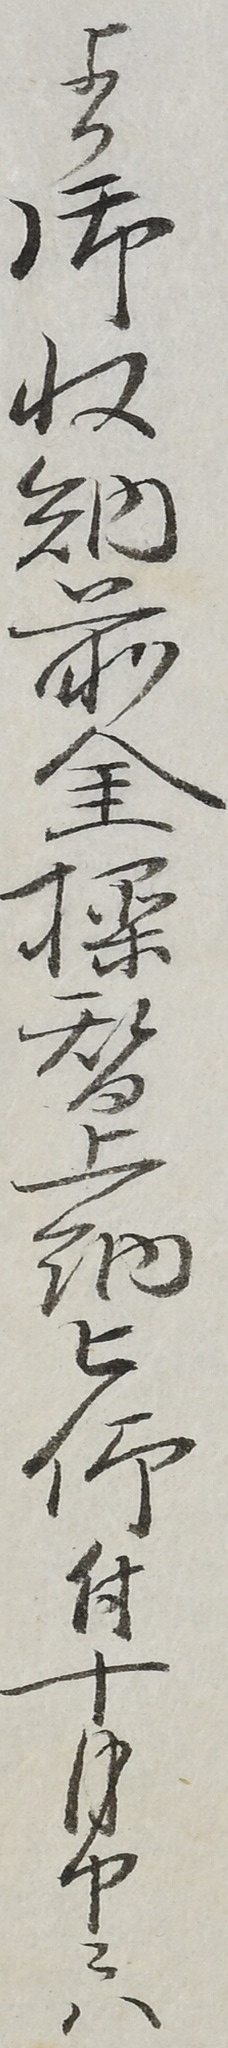より御収納前全操替上納被仰付十月中ニハ
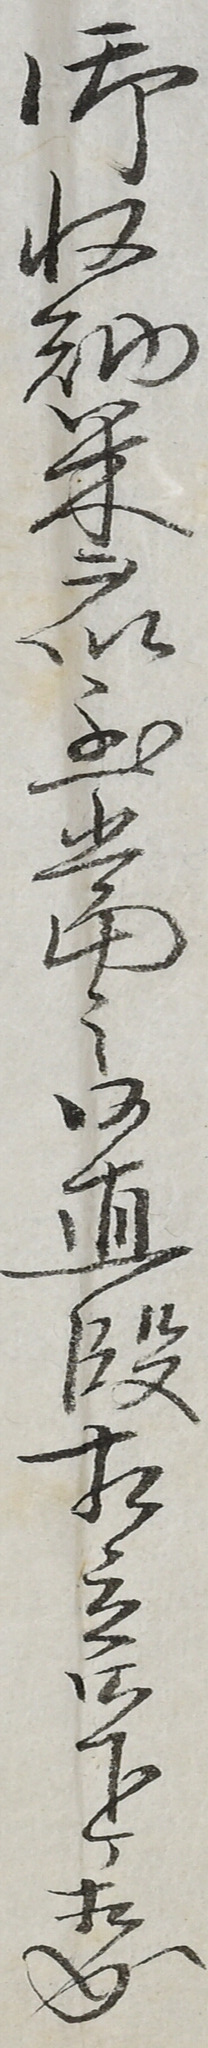御収納米ヲ以至当之御直段相立御下ケ相成
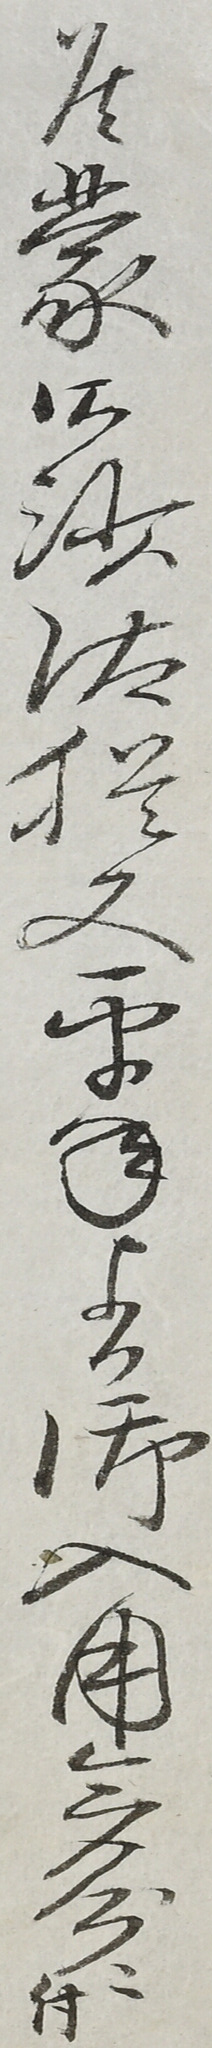候蒙御沙汰猶又平年より御入用多分ニ付
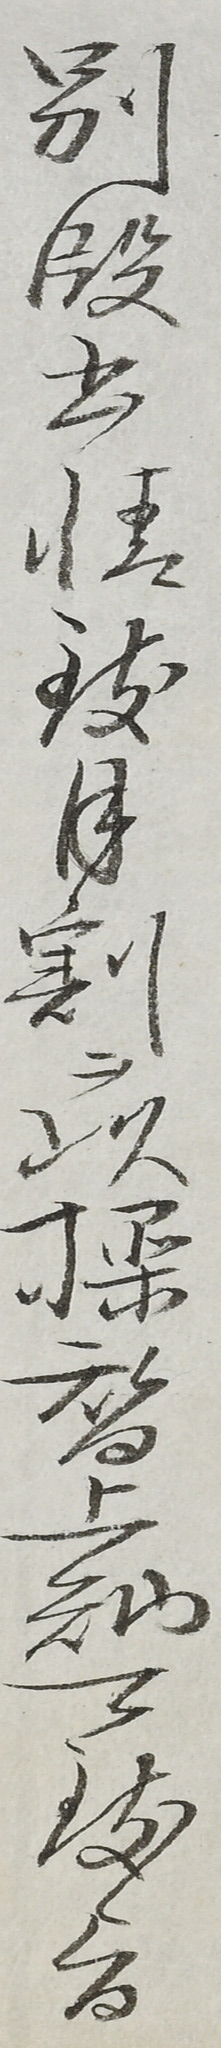別段出精致月割ヲ以操替上納可致旨
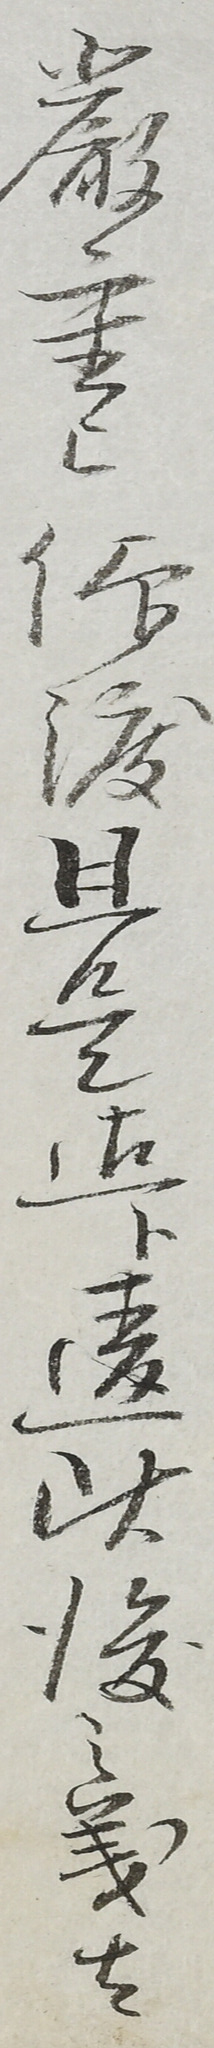厳重被仰渡且是迄ト違此後之義者
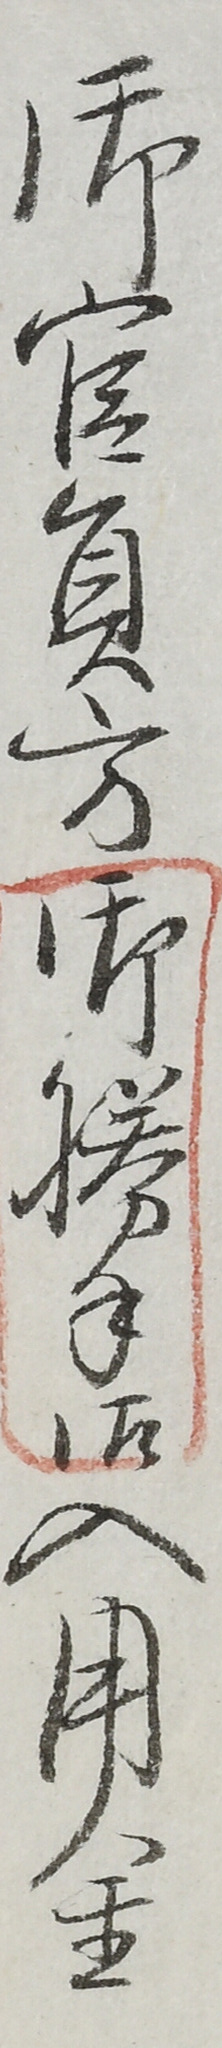御官員方御勝手御入用金
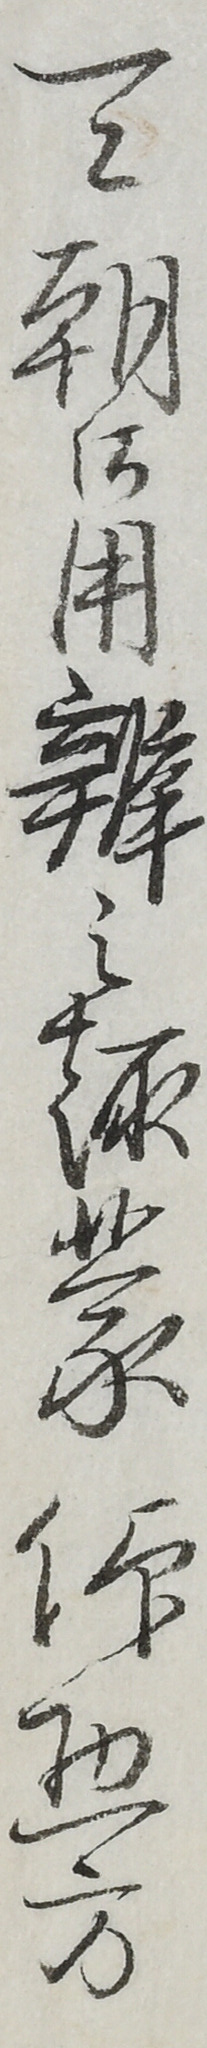天朝臣用弁之趣蒙仰惣方

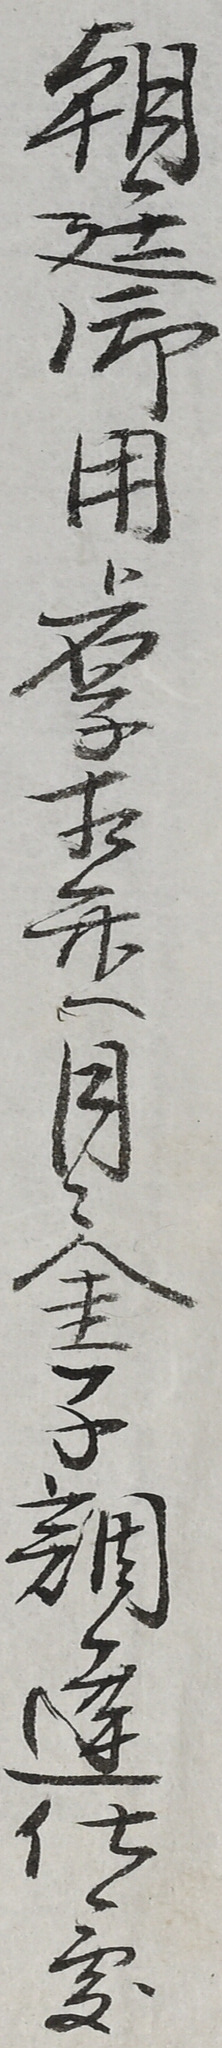朝廷御用ト厚相弁ヘ月々金子調達仕候処
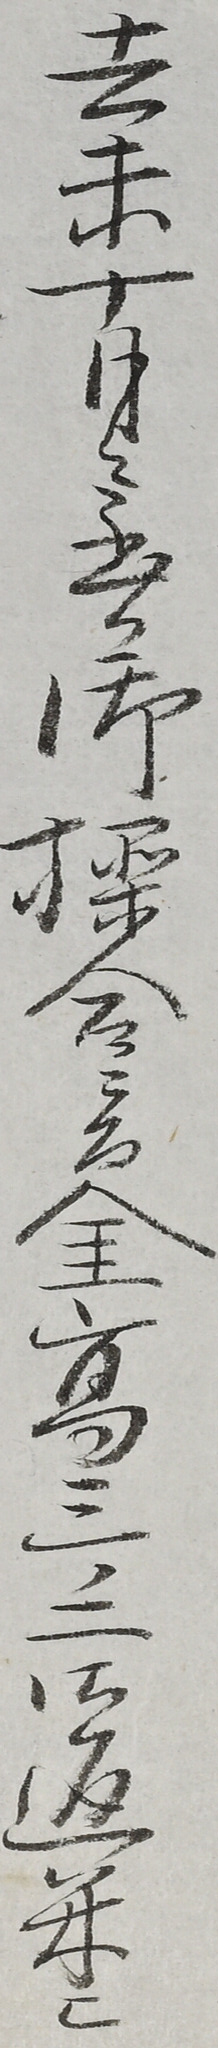去未十月之至リ御操合ニ而金高三ノ二御返米ニ
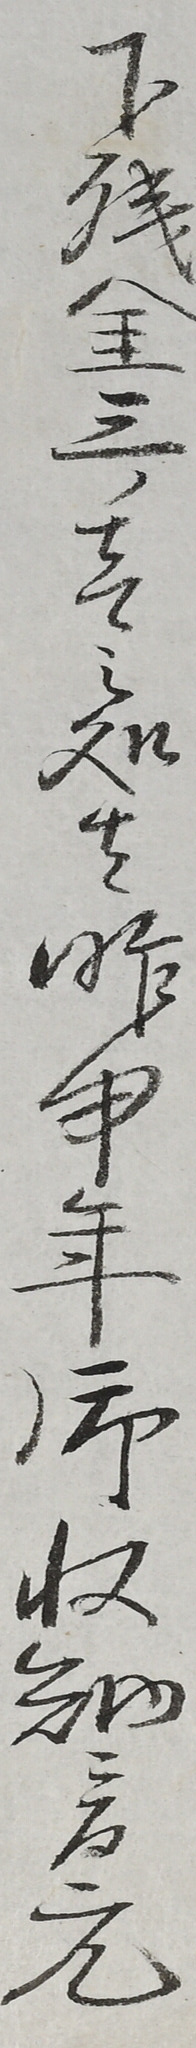下残金三ノ壱之所者昨申年御収納ニ而元
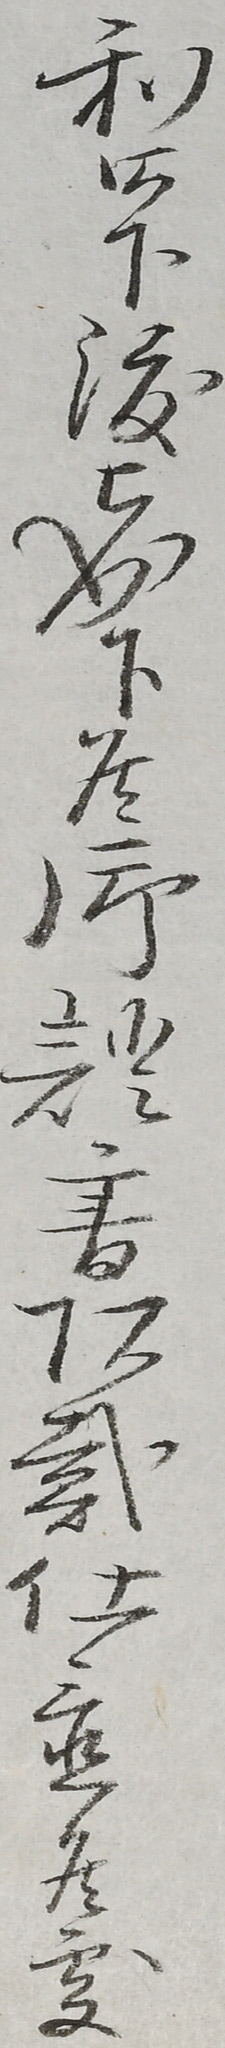利トモ下渡被成下候御証書頂戴仕置候処
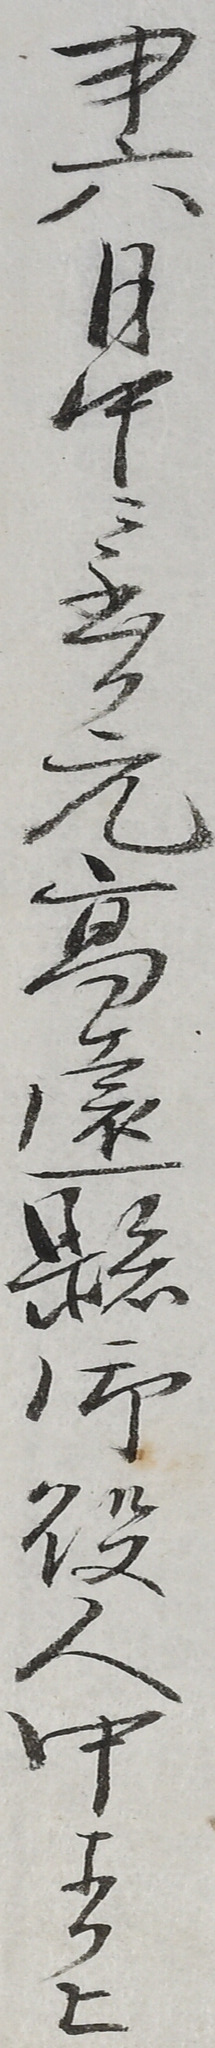申六月中ニ至リ元高遠県御役人中より被
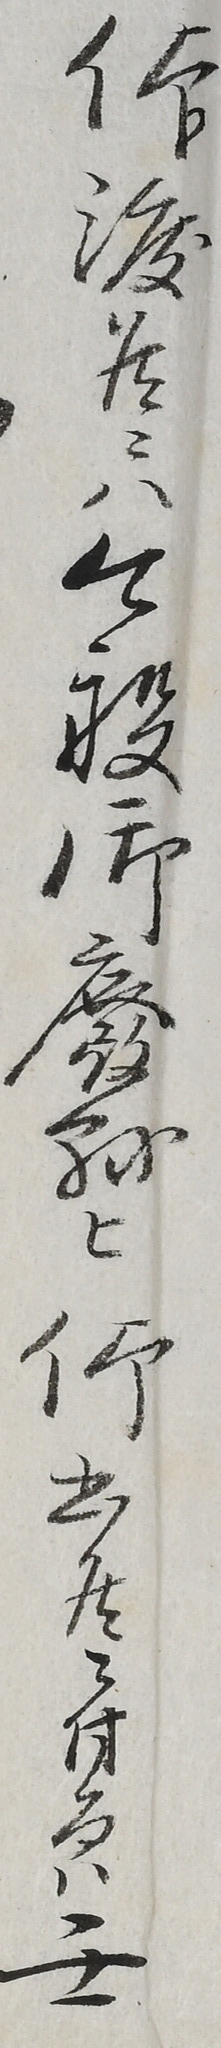仰渡候ニハ今般御廃県被仰出候ニ付而ハ壬
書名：乍恐以書付奉願上候
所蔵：伊那市立高遠町図書館・合同会社AMANE
